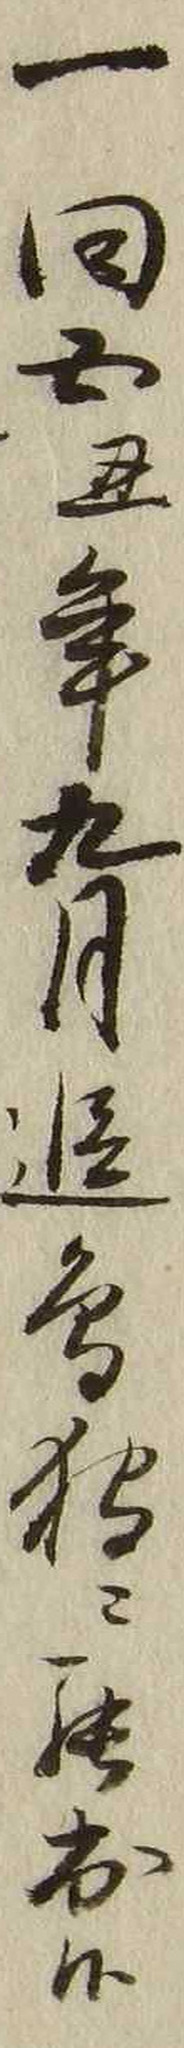一同五丑年九月追鳥狩ニ罷出候
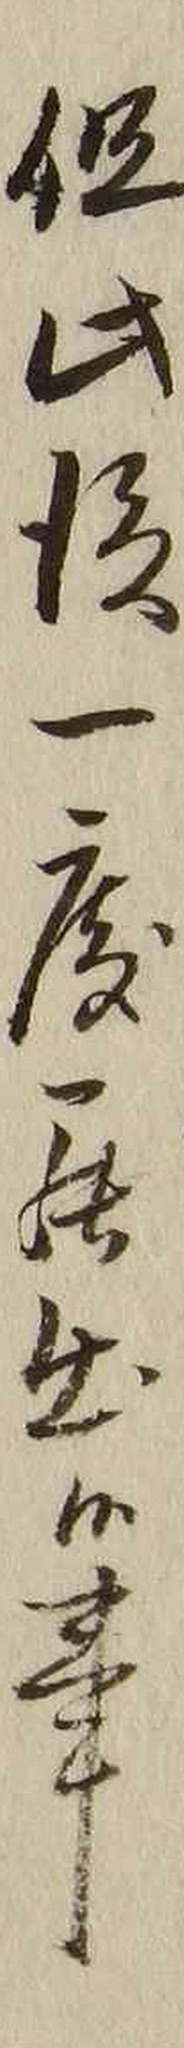但此後一度罷出候事
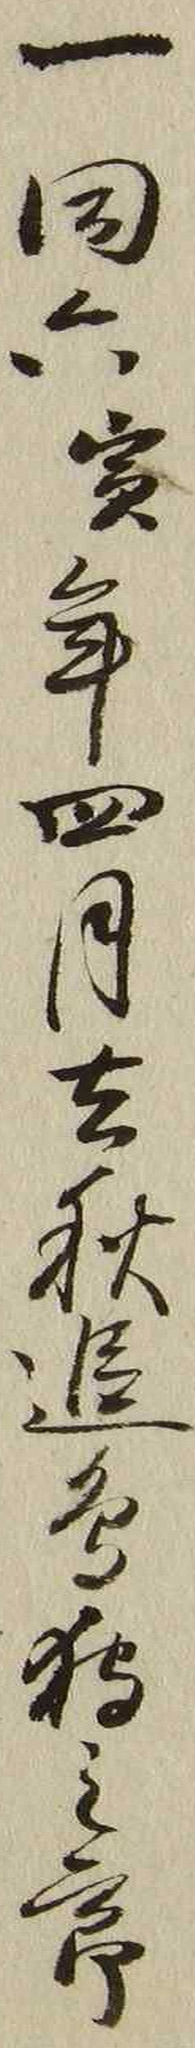一同六寅年四月去秋追鳥狩之節
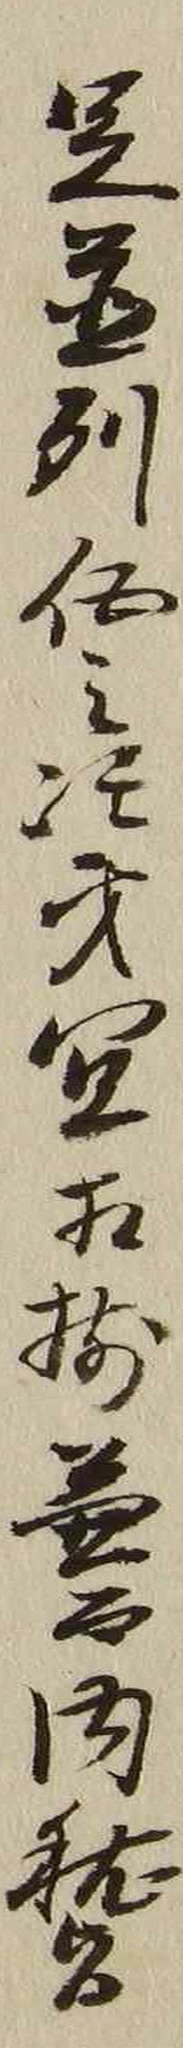足並列伍之次第宜相揃兼而内稽
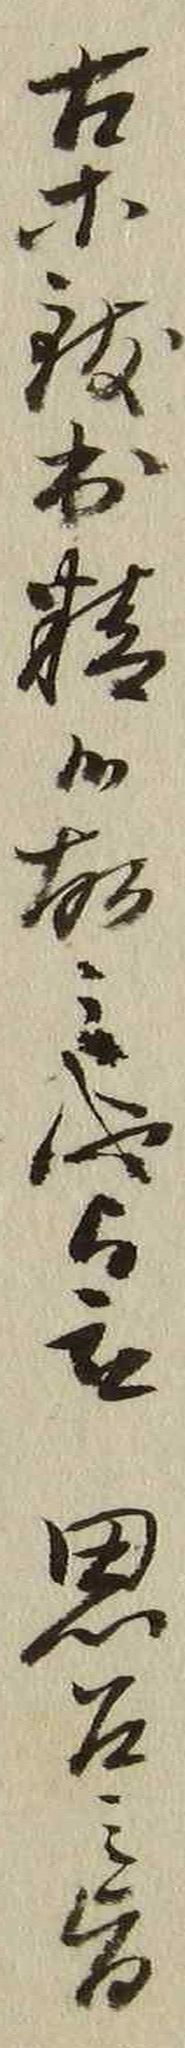古等致出精候故之儀与被思召之旨
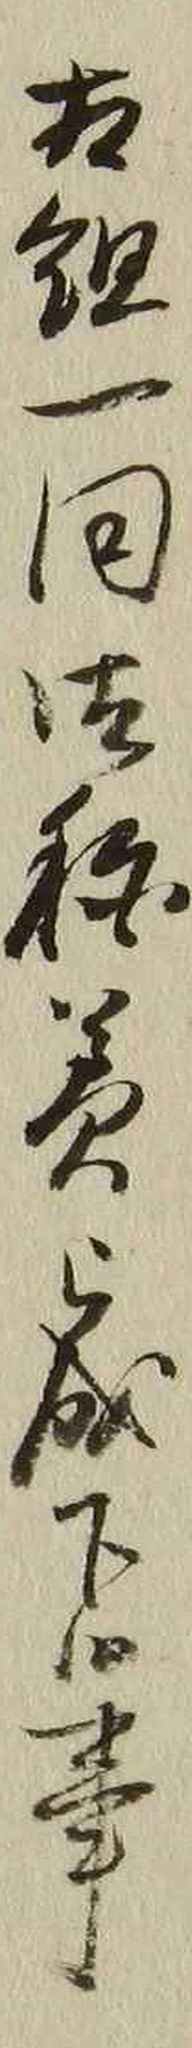相組一同御称美被成下候事
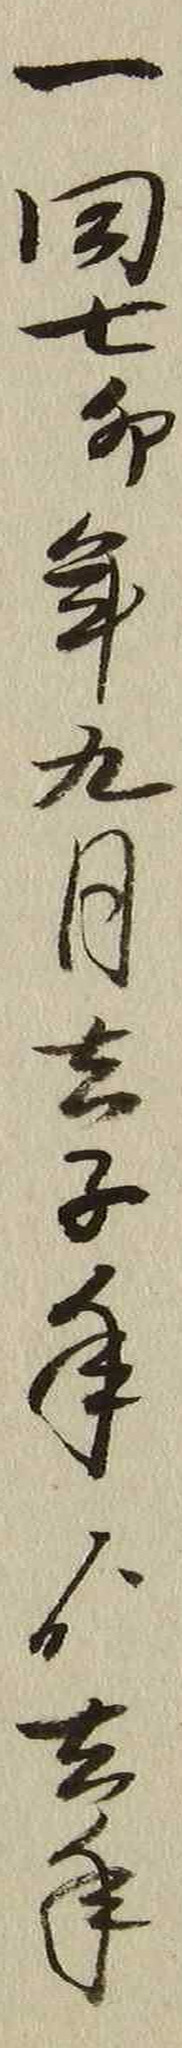一同七卯年九月去子年ゟ去年
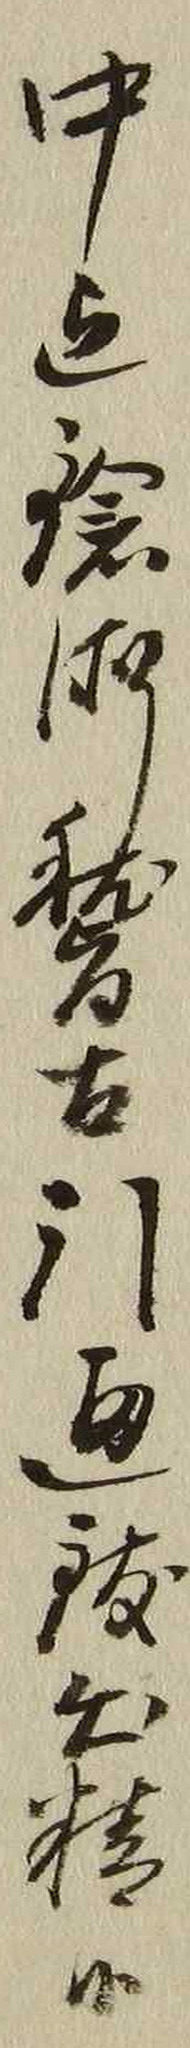中迄鎗術稽古引通致出精候
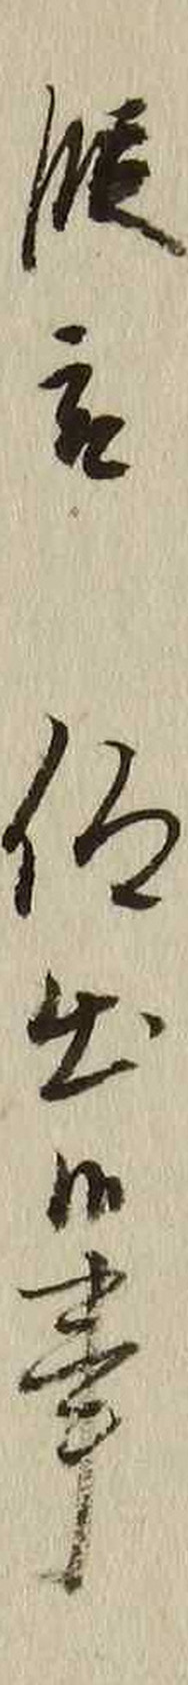段被仰出候事
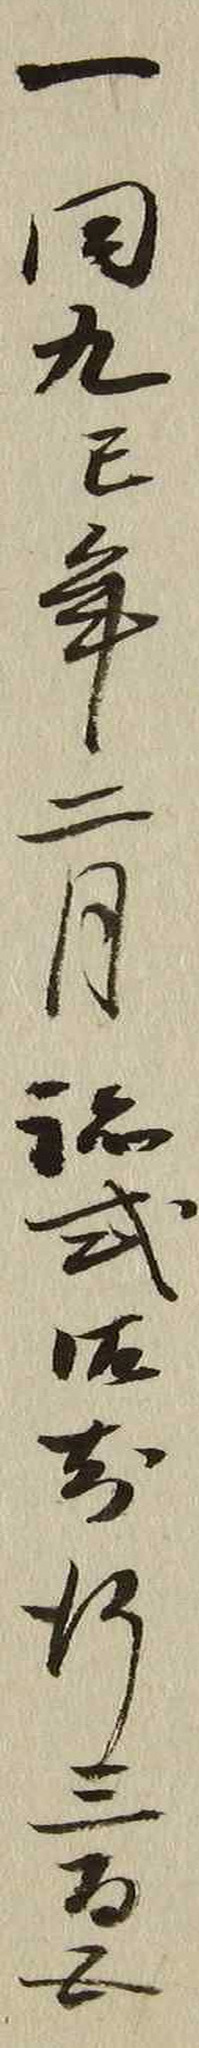一同九巳年二月跡式御知行三百五
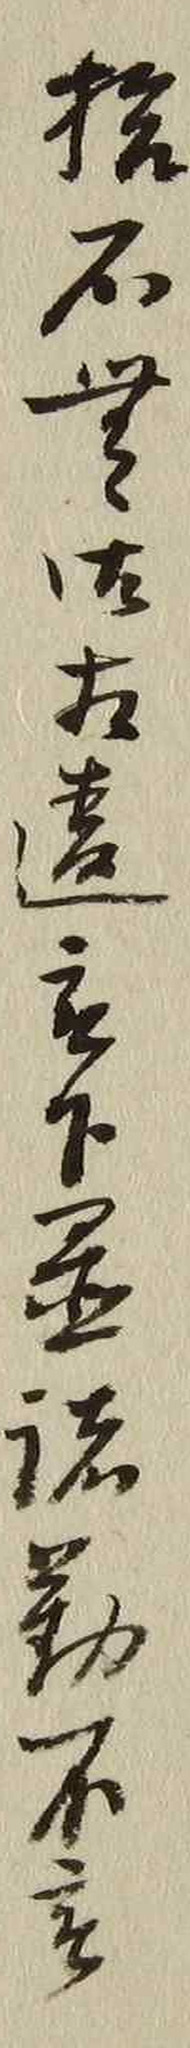拾石無御相違被下置諸勤不被
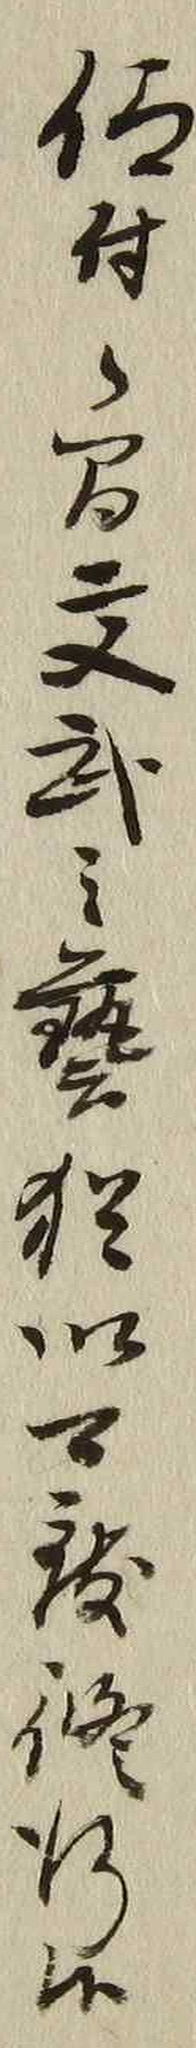仰付候間文武之芸猶以可致修行候
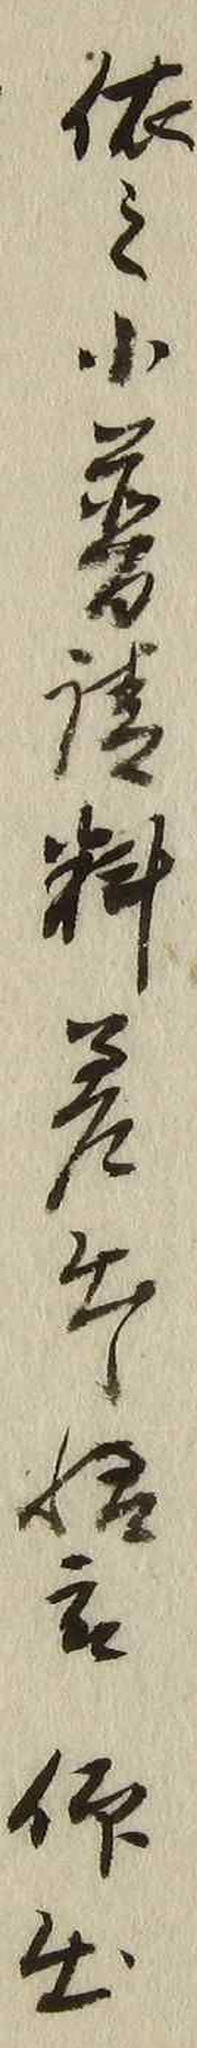依之小普請料差出候様被仰出
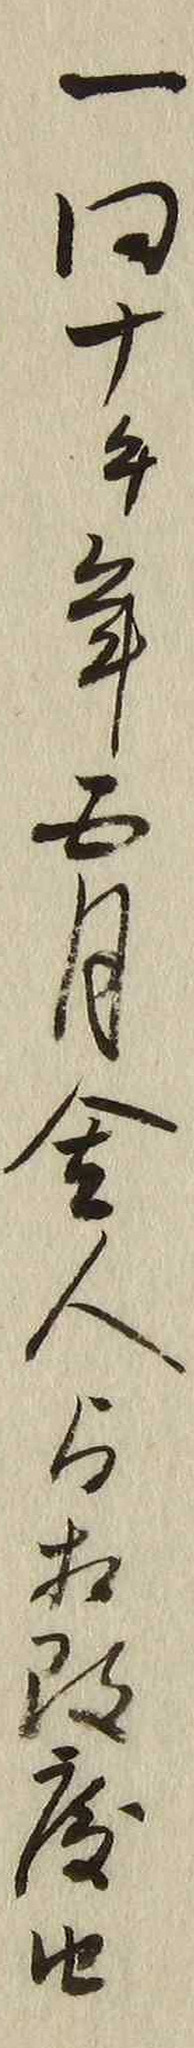一同十午年五月舎人与相改度由
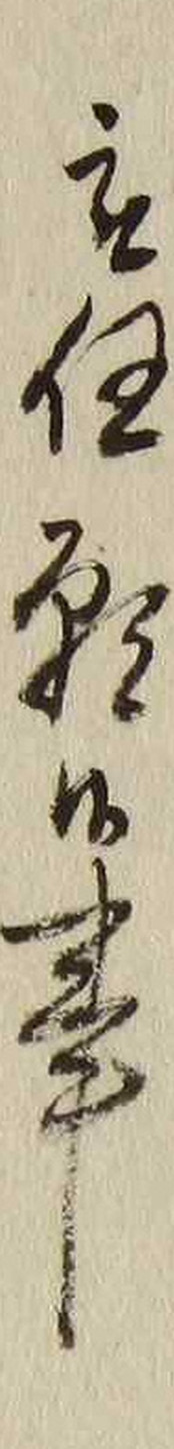被任願候事
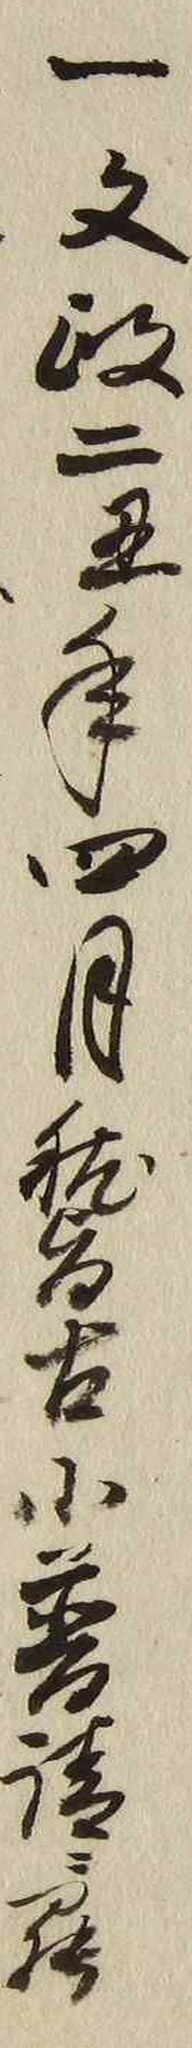一文政二丑年四月稽古小普請ニ罷
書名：諸士系譜　巻之355　す之部5
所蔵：会津若松市立会津図書館
